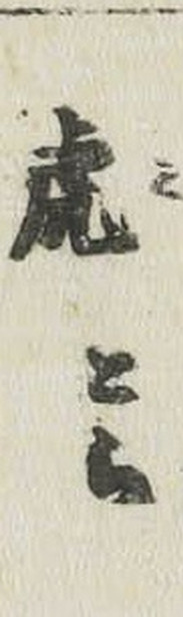虎とら
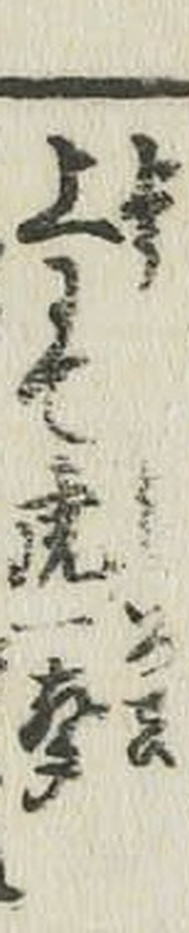上にて虎一声
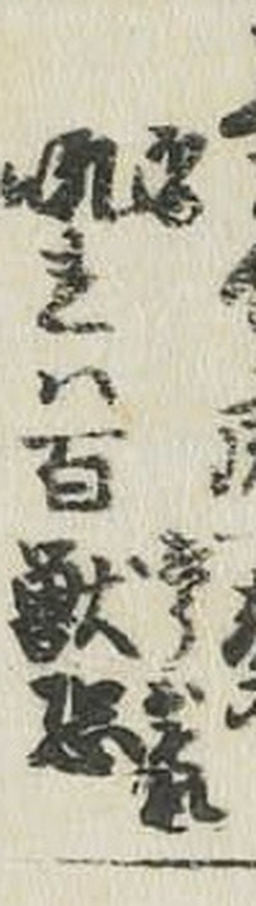吼れは百獣恐
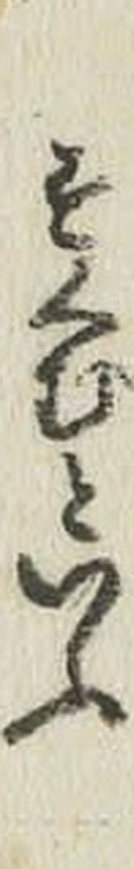すくむといふ
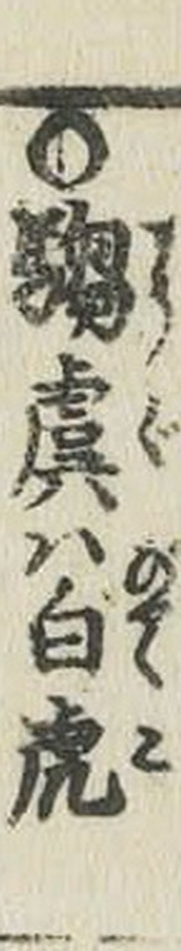○騶虞は白虎
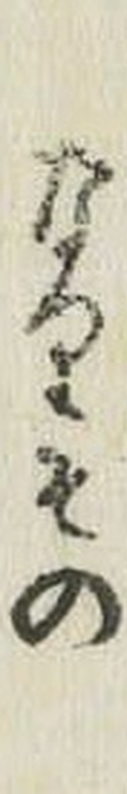なりその
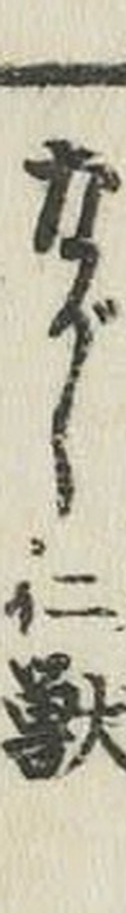ながし仁獣
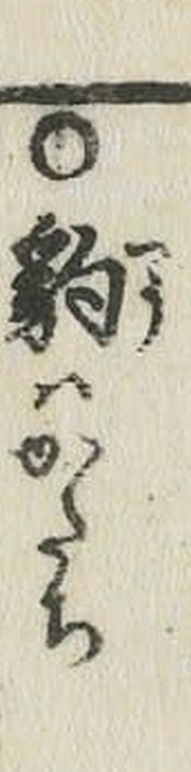○豹はかたち
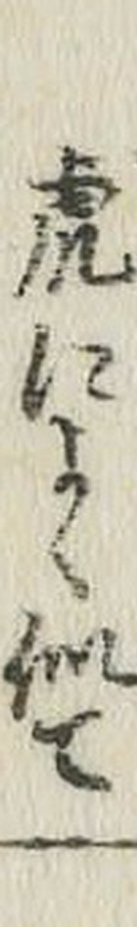虎によく似て
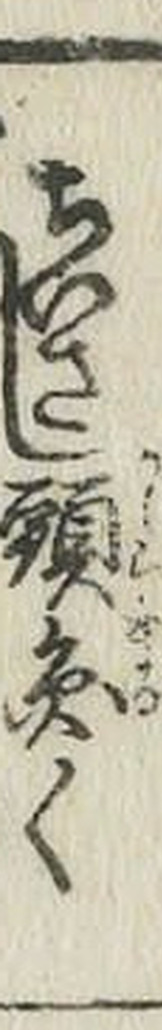ちいさし頭円く
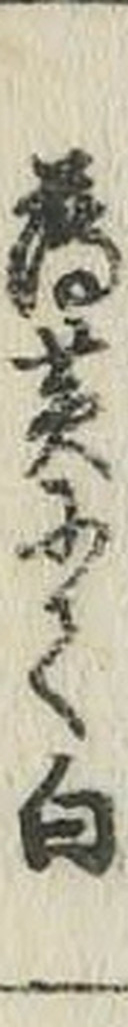薄黄にて白
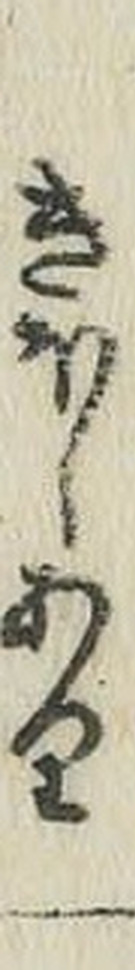きほしあり
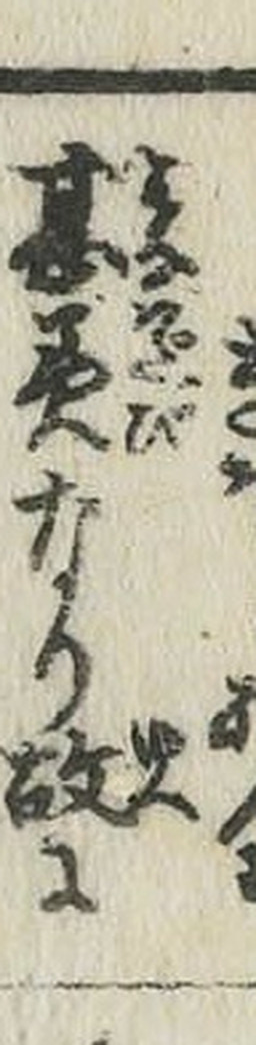甚美なり故に
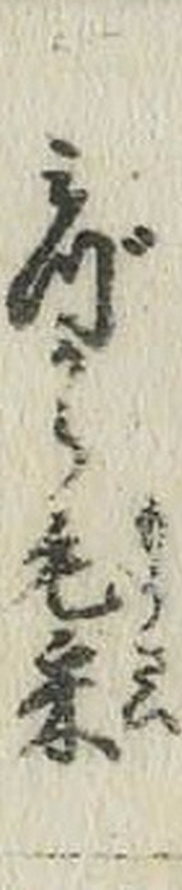みづから毛采
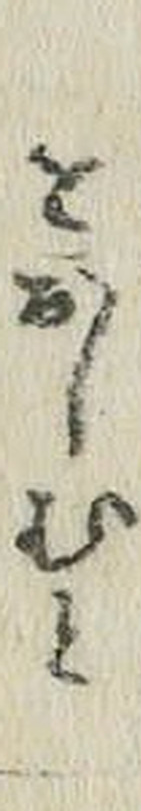をおしむと

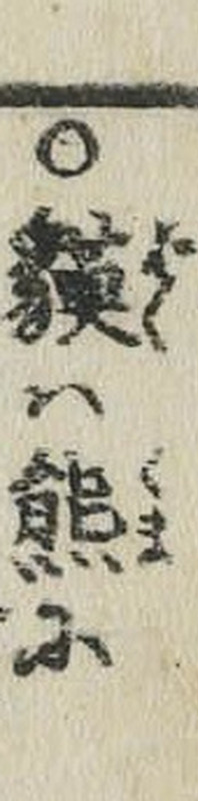○貘は熊に
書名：増補頭書訓蒙図彙大成 10巻 6:巻之12-13
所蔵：東京学芸大学教育コンテンツアーカイブ
